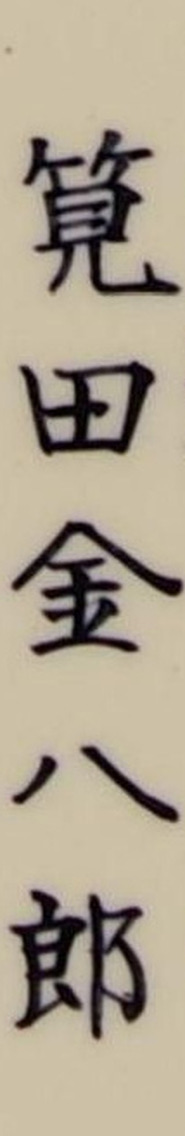筧田金八郎
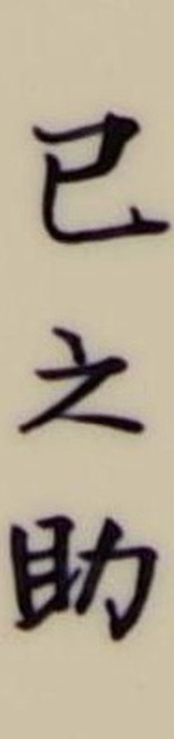巳之助
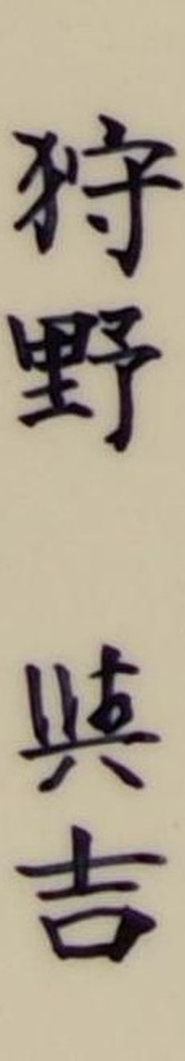狩野与吉
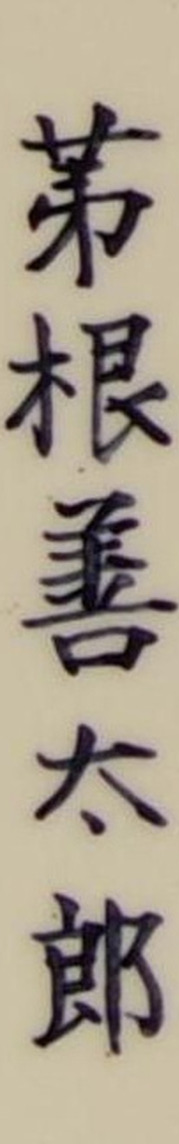茅根善太郎

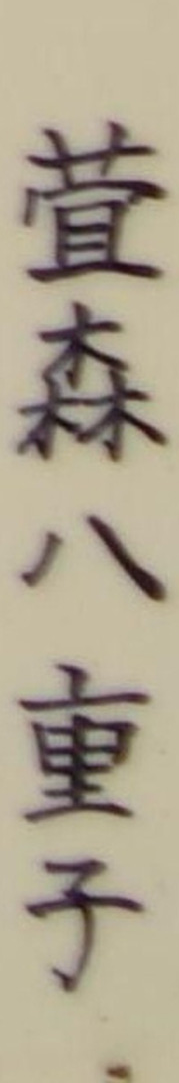萱森八重子
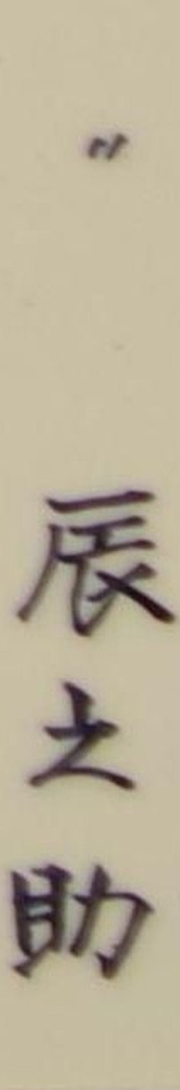辰之助
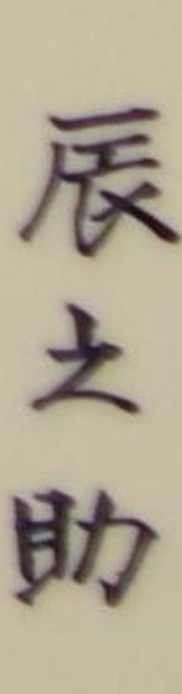辰之助
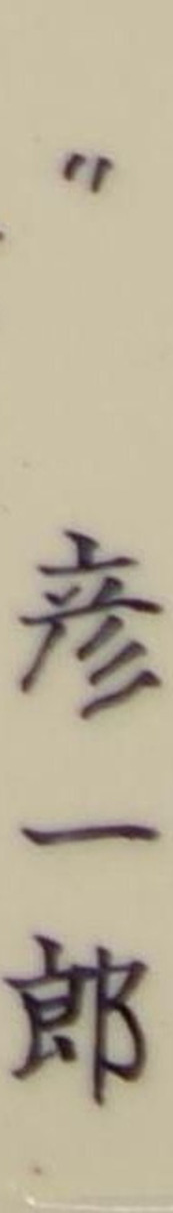彦一郎
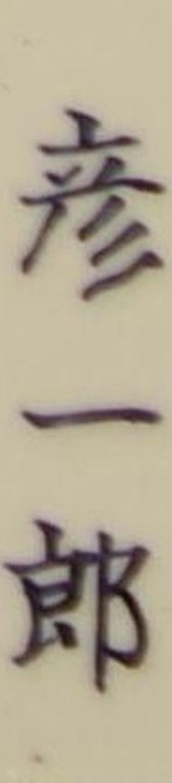彦一郎
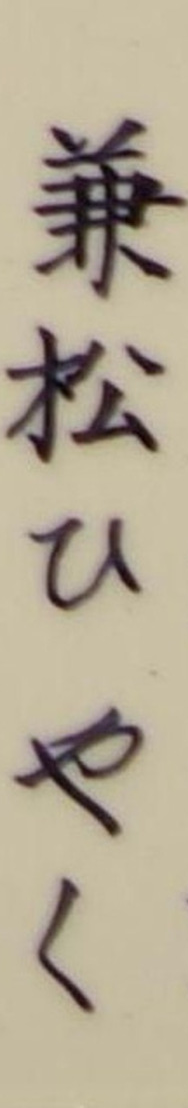兼松ひやく
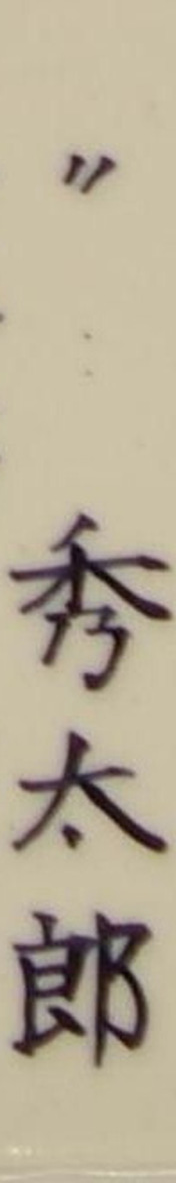秀太郎
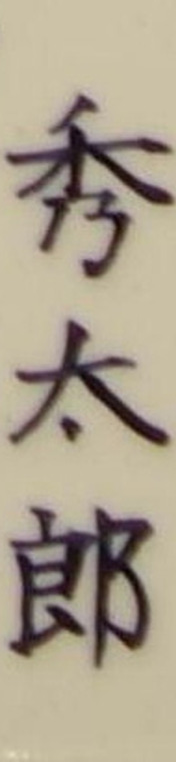秀太郎
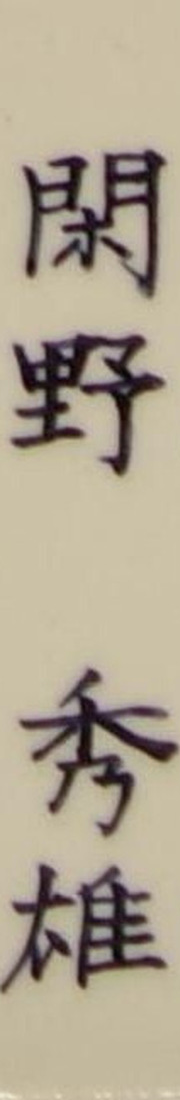閑野秀雄
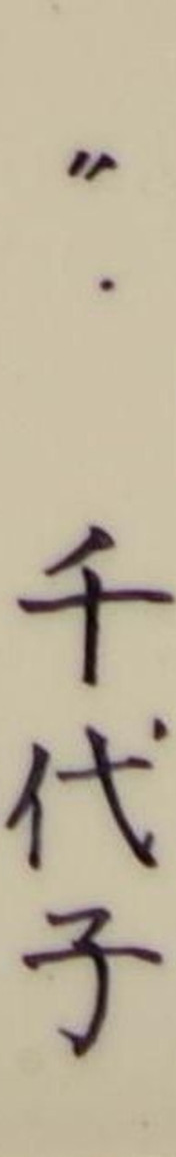千代子
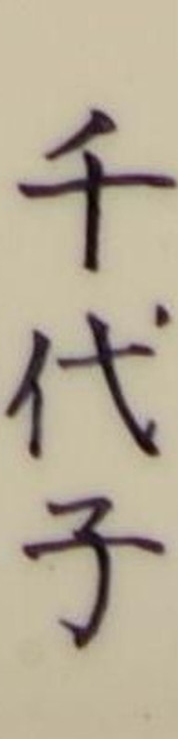千代子
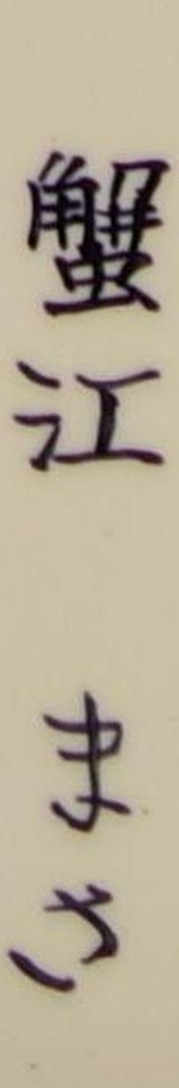蟹江まさ
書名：E~L
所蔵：高野山金剛峯寺
